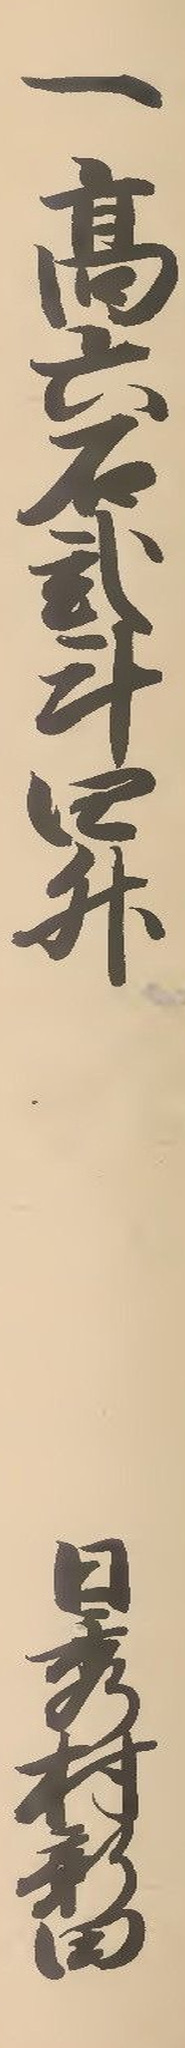一高六石弐斗四升日秀村新田
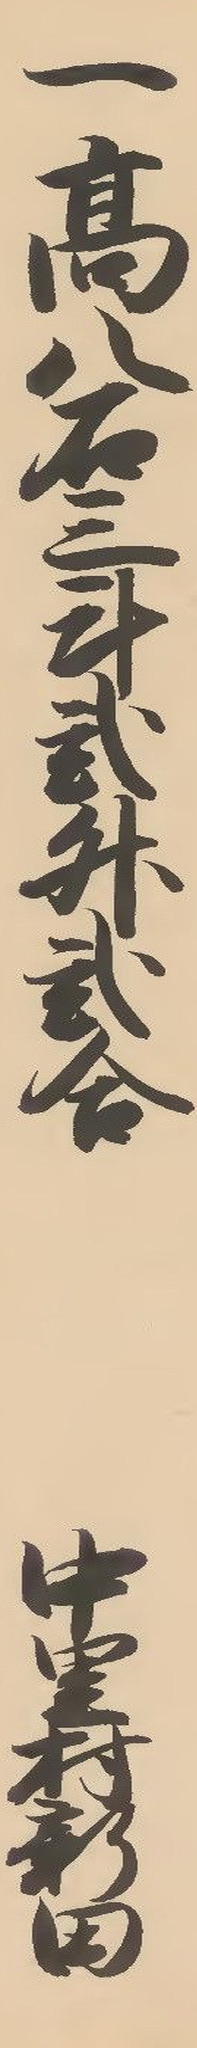一高八石三斗弐升弐合中里村新田
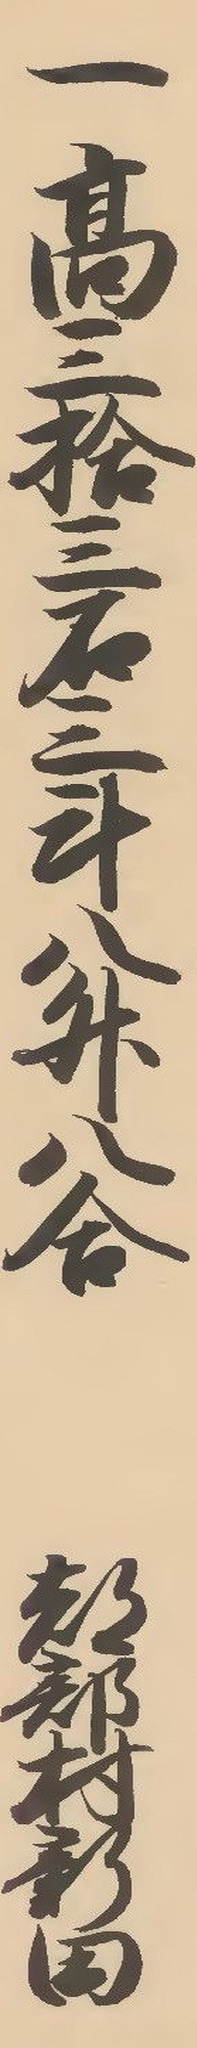一高三拾三石三斗八升八合都部村新田
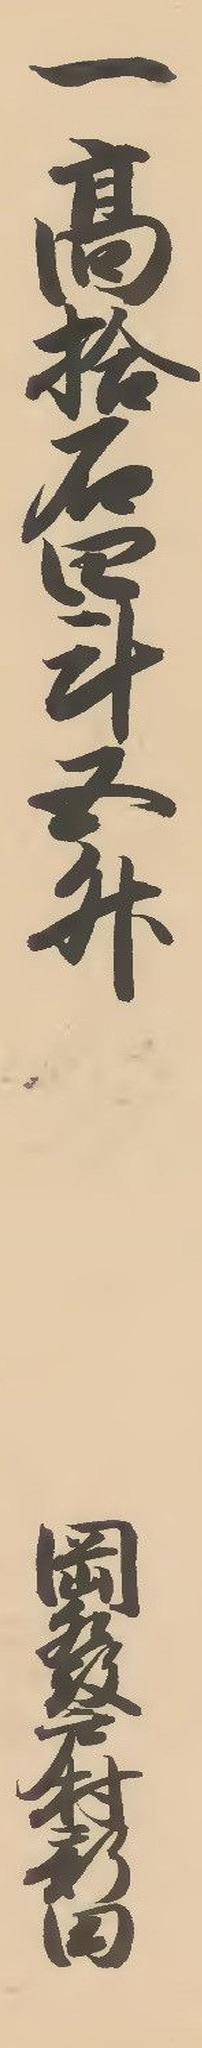一高拾石四斗五升岡発戸村新田

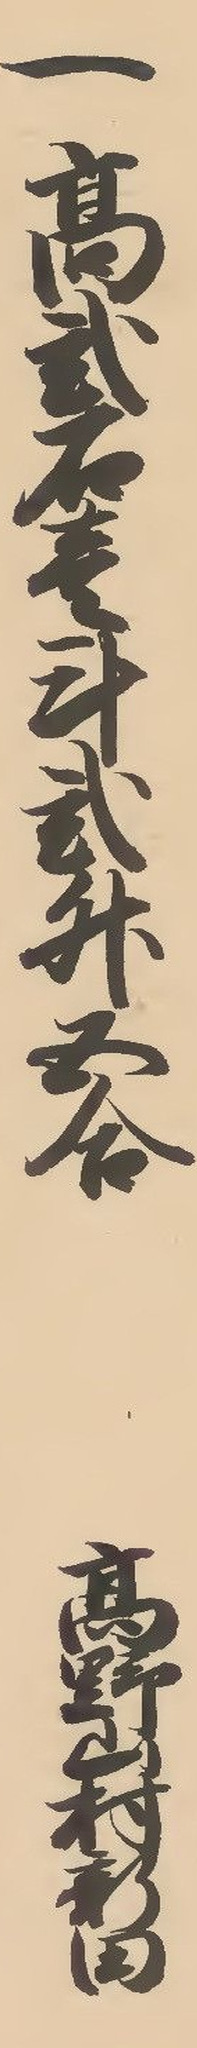一高弐石壱斗弐升五合高野山村新田
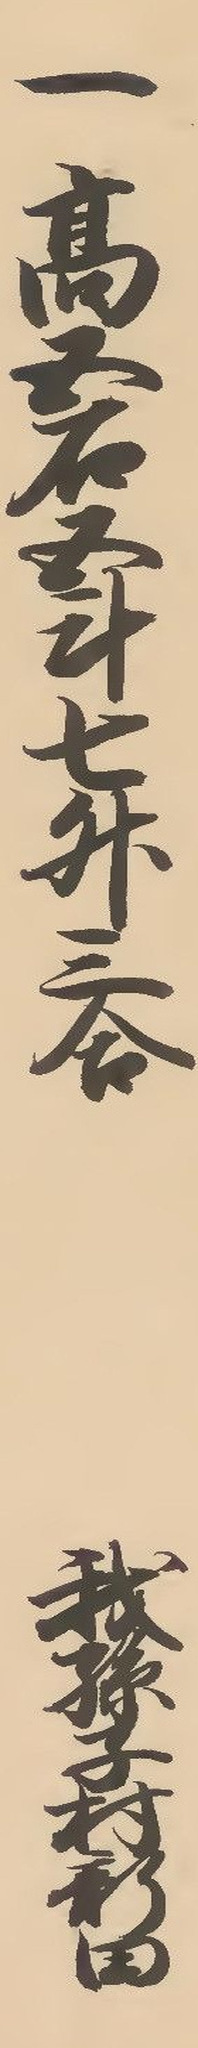一高五石五斗七升三合我孫子村新田
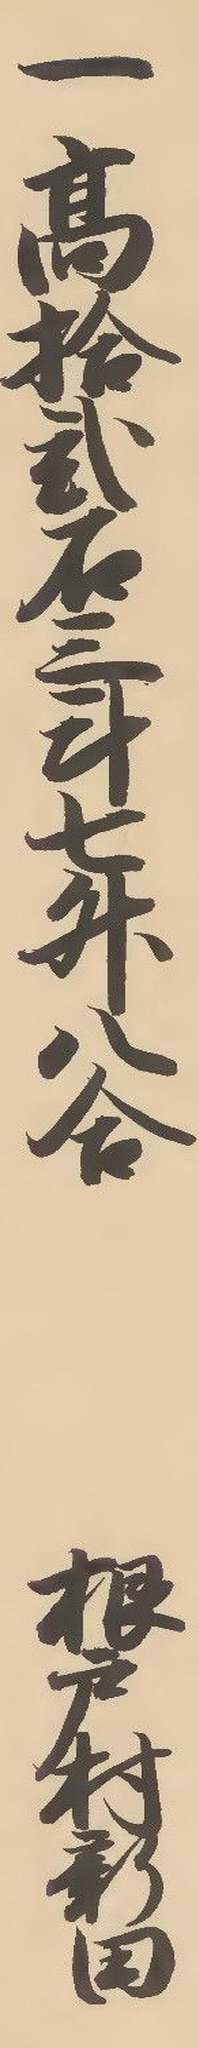一高拾弐石三斗七升八合根戸村新田
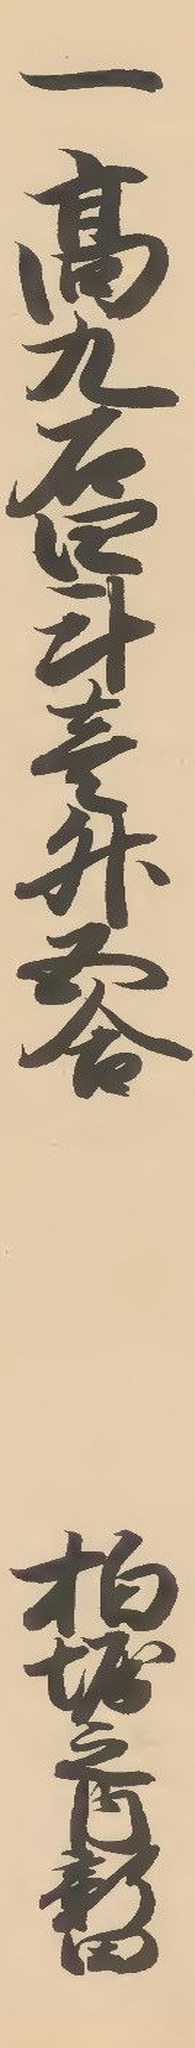一高九石四斗壱升五合柏堀之内新田
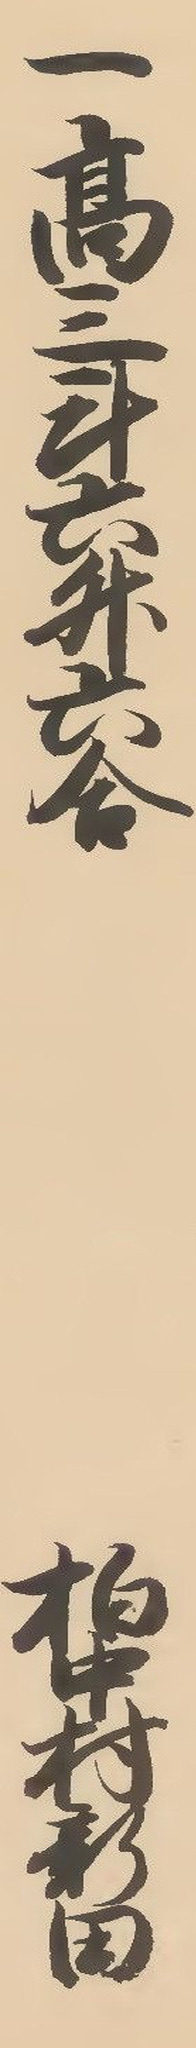一高三斗六升六合柏中村新田
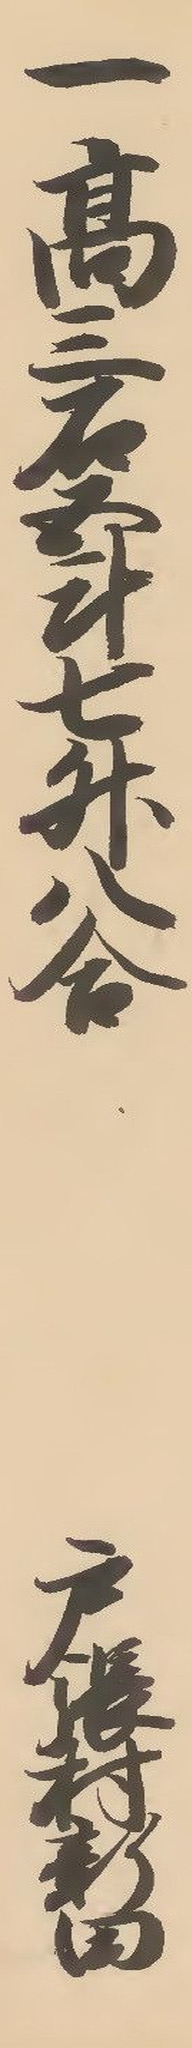一高三石五斗七升八合戸張村新田

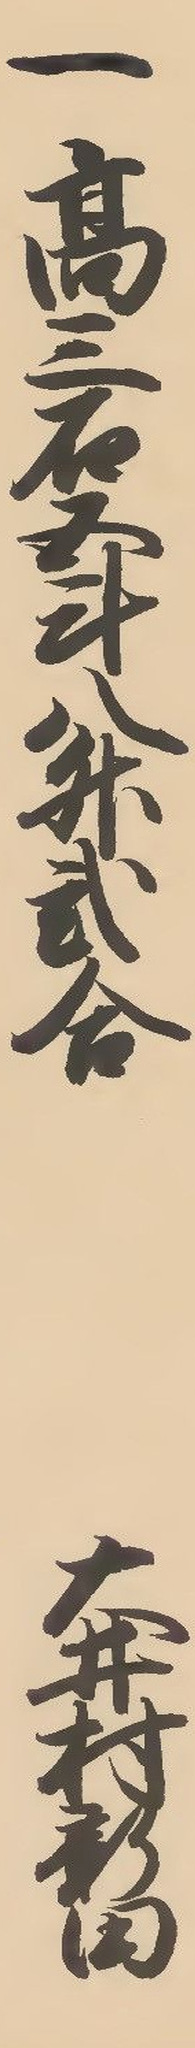一高三石五斗八升弐合大井村新田
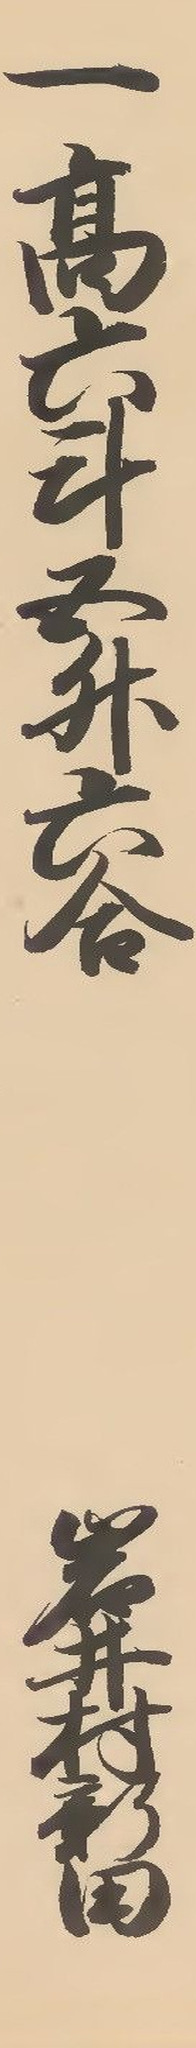一高六斗五升六合岩井村新田
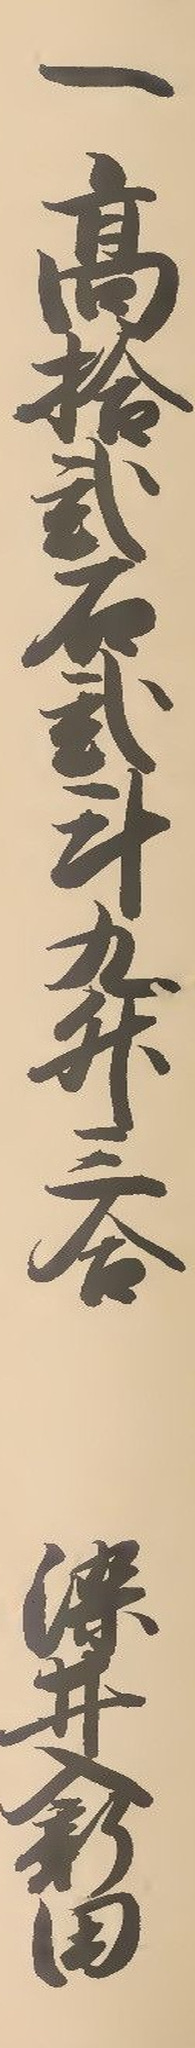一高拾弐石弐斗九升三合染井入新田
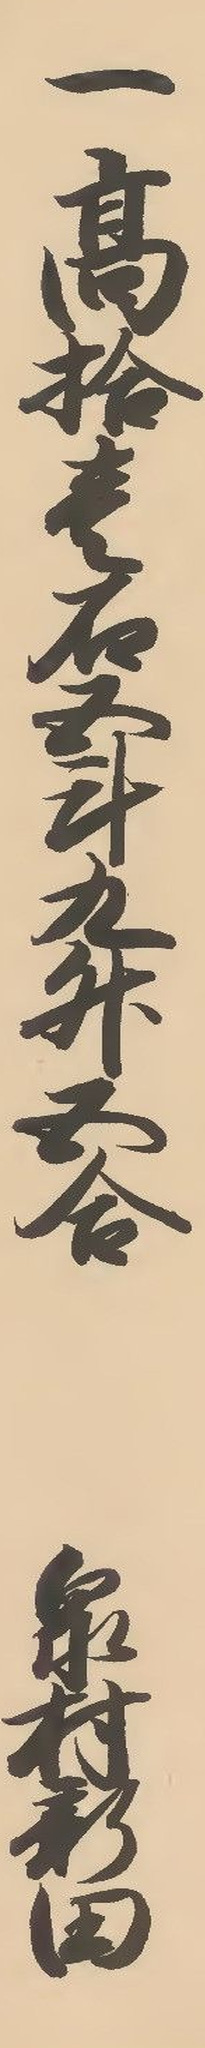一高拾壱石五斗九升五合泉村新田
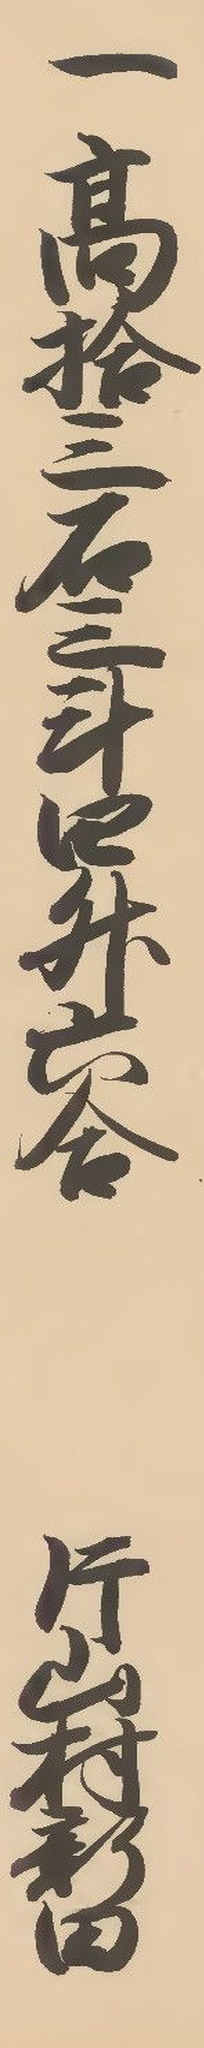一高拾三石三斗四升六合片山村新田
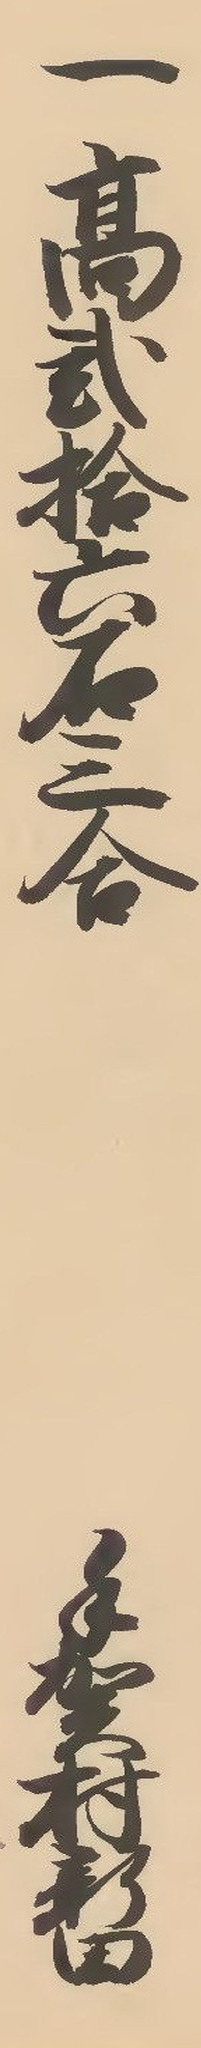一高弐拾六石三合手賀村新田
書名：下総国郷帳
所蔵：国立公文書館 National Archives of Japan
